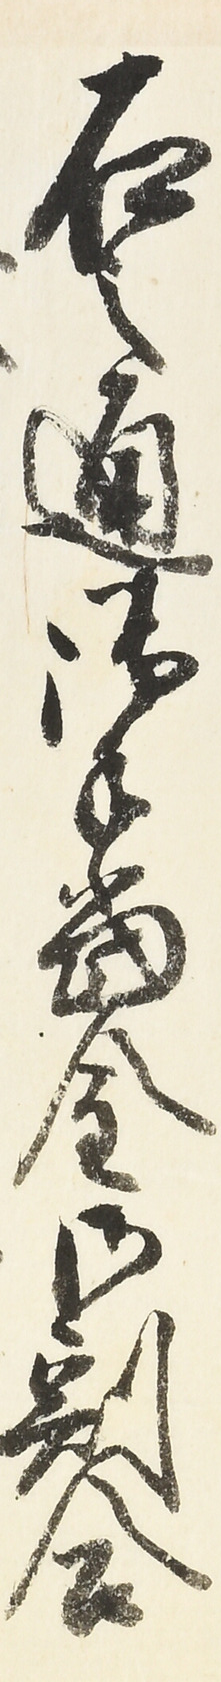右之通御手当金御割合
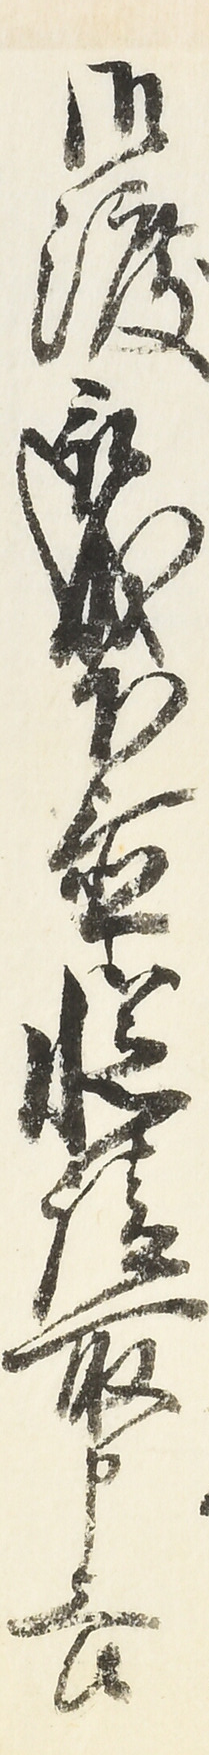御渡被成下置慥請取申上候
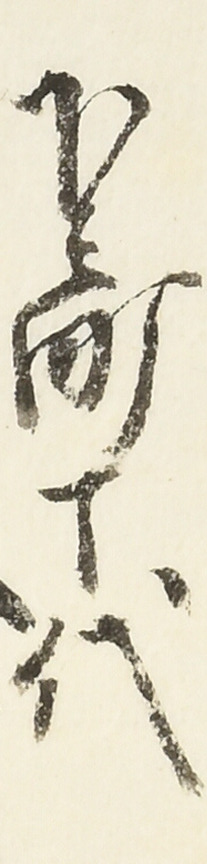下モ町丁代
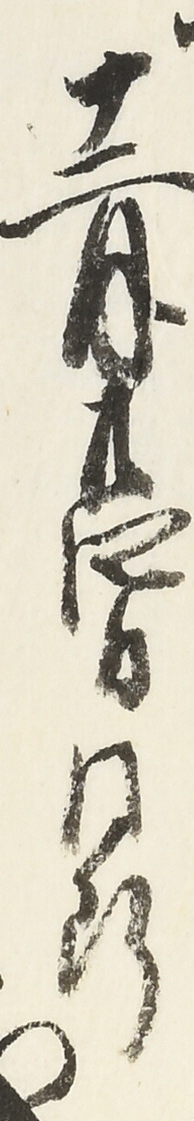十二月廿四日同断

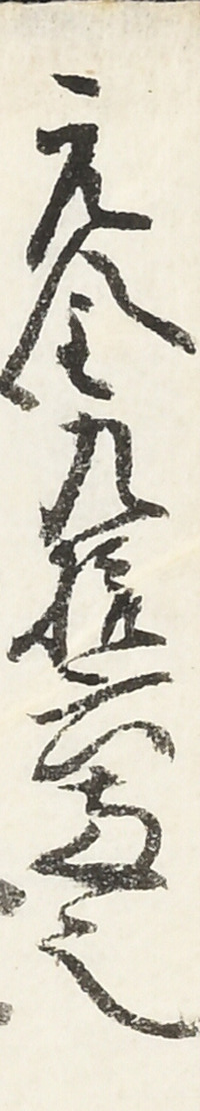元金九拾六両也
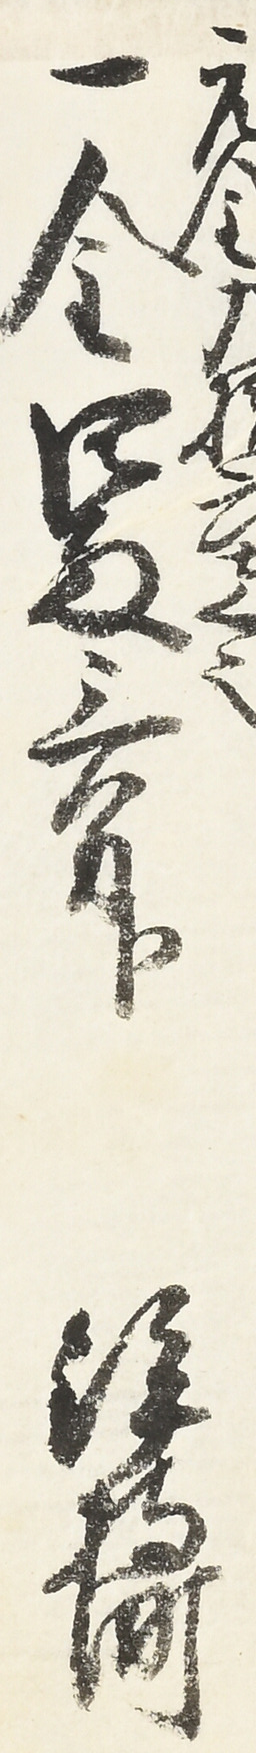一金四両三分ト鉾持町
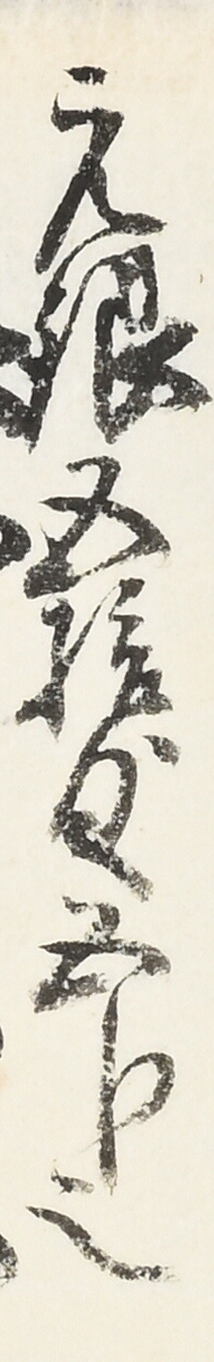元銀五拾匁五分也
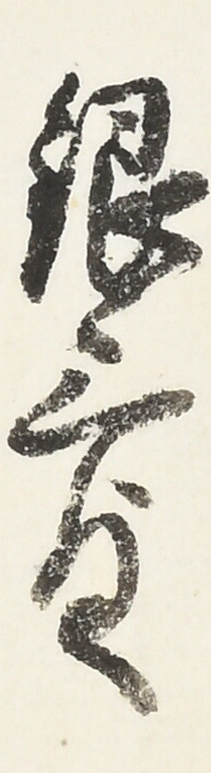銀三匁
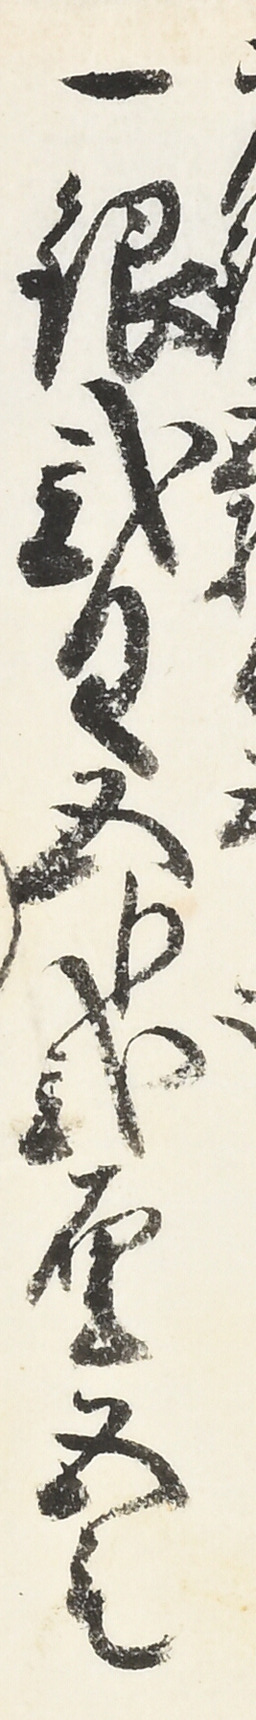一銀弐匁五分弐厘五毛
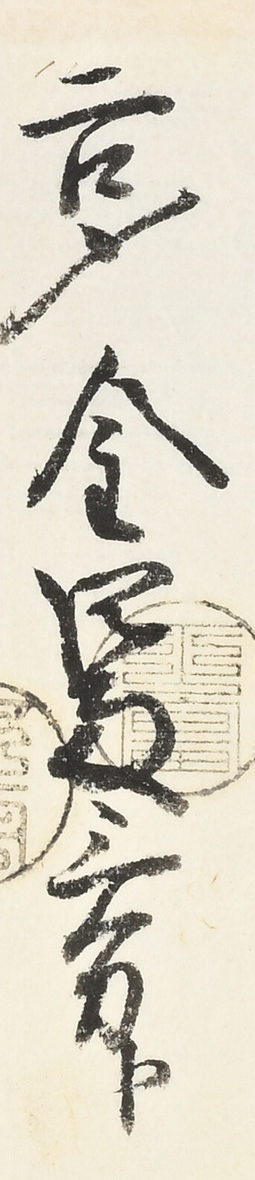二口〆金四両三分ト
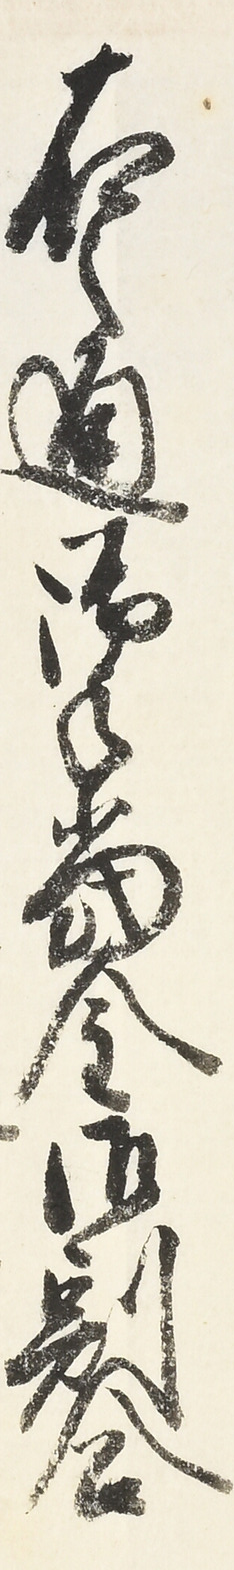右之通御手当金御割合
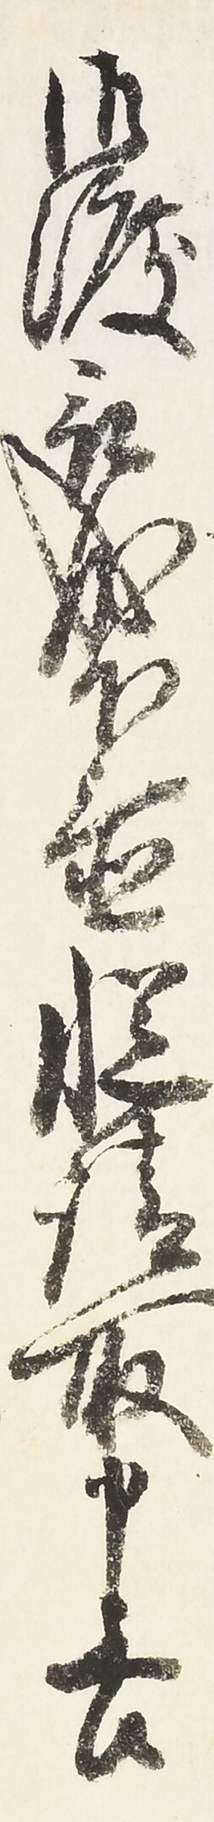御渡被成下置慥請取申上候
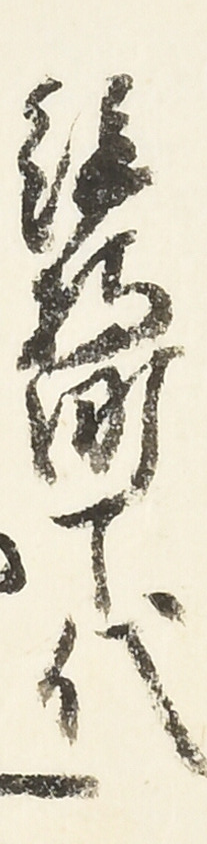鉾持町丁代
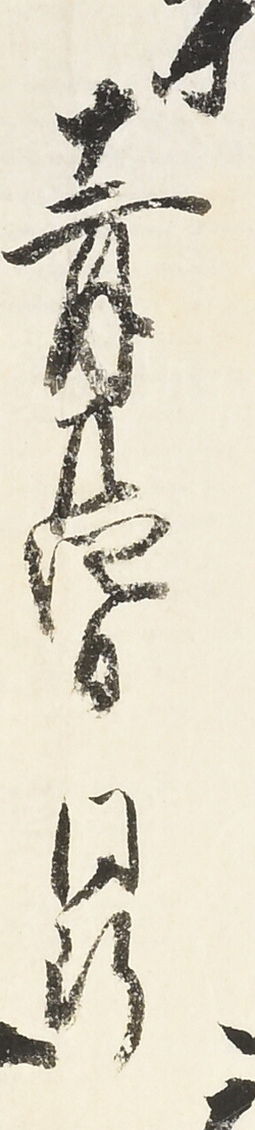十二月廿四日同断
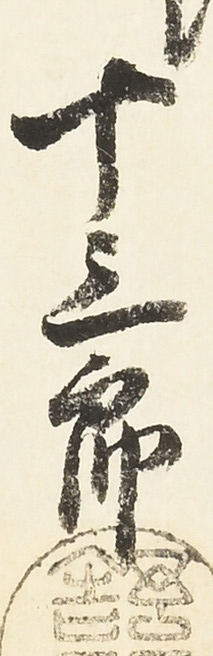十三郎
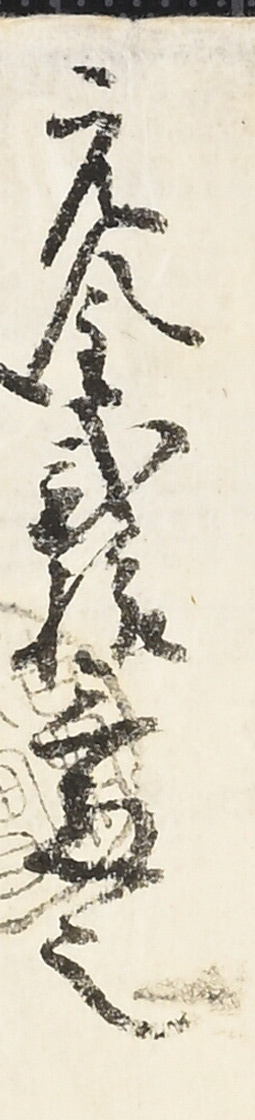元金弐拾三両也
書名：御才覚金御利足割渡扣帳
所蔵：伊那市立高遠町図書館・合同会社AMANE
